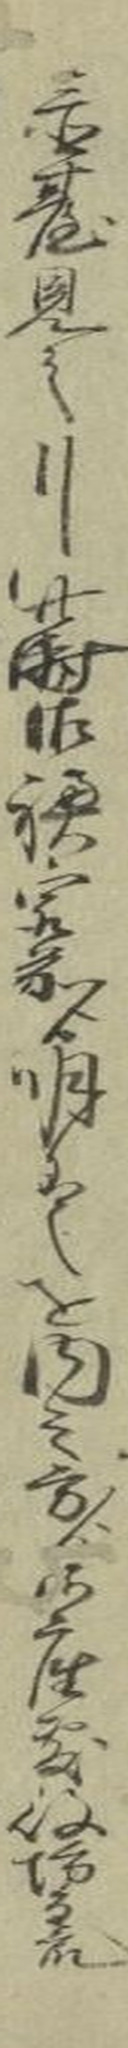置台見之引此時御襖最前ゟ明有之を内之方ゟ御座敷役坊主衆
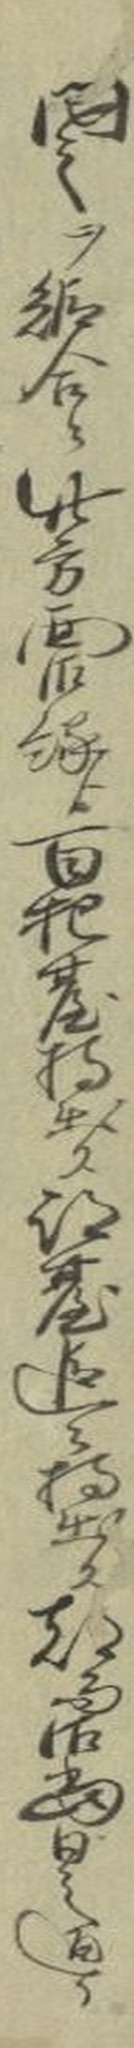閉之を緞合に此方西御縁え百把台持出す跡台迄持出す都て御当日之通り
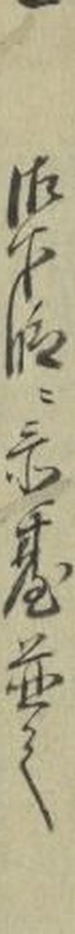一御下段に置台並之
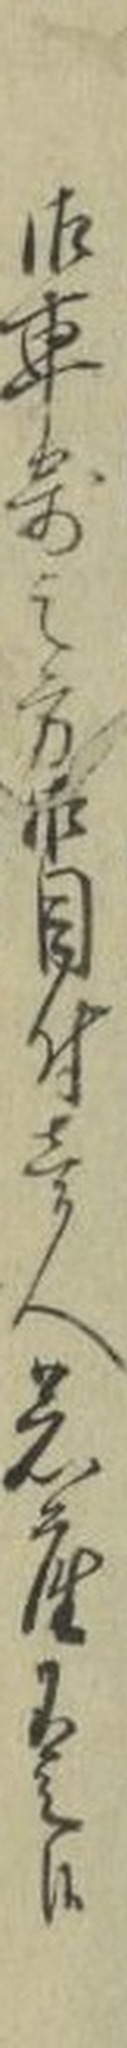一御車寄之方御目付壱人着座有之候
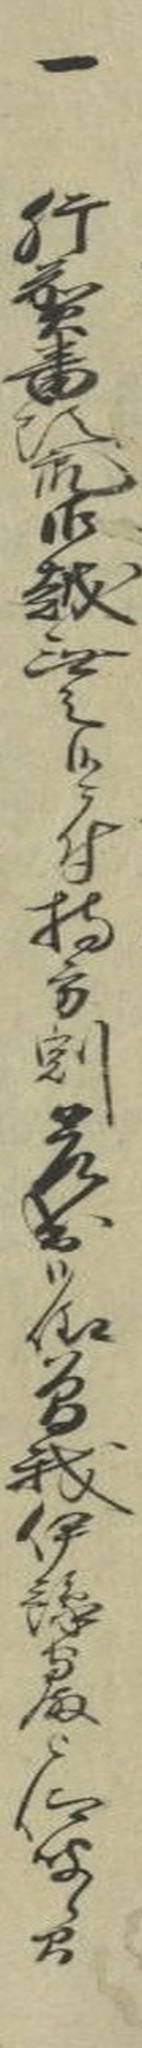一肝煎番頭衆御越無之候に付持方割差出候様曽我伊予守殿被仰聞候間
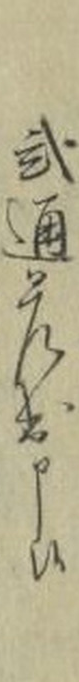弐通差出申候
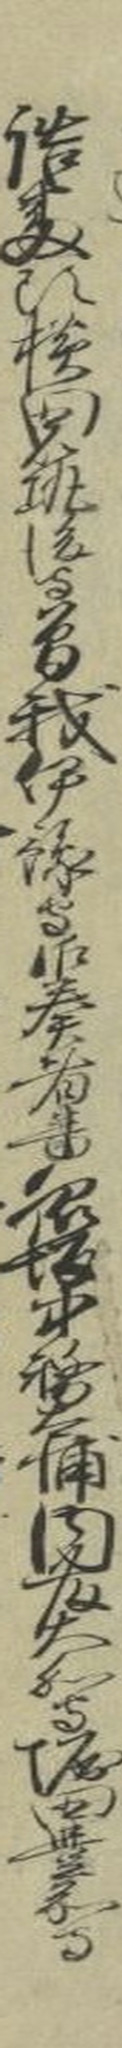一詰番頭横田筑前守曽我伊予守御奏者番脇坂中无太輔内藤大和守堀田豊前守
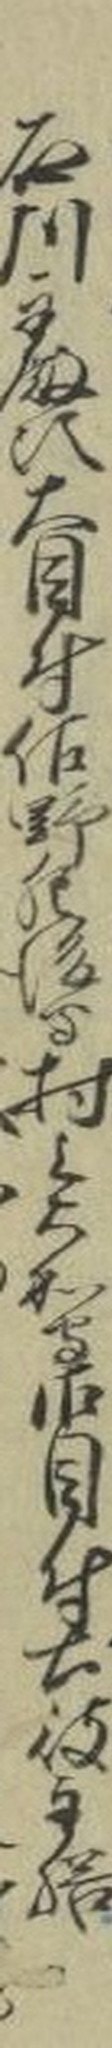石川主殿頭大目付佐野肥後守村上大和守御目付土岐主膳
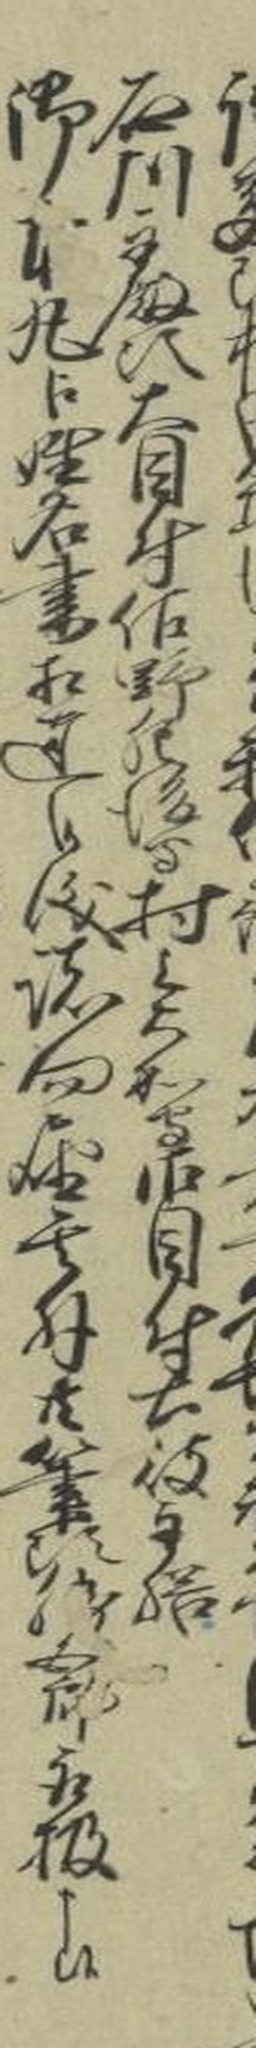一御本丸え姓名書相達候儀諸向届其外共筆頭勝五郎取扱申候
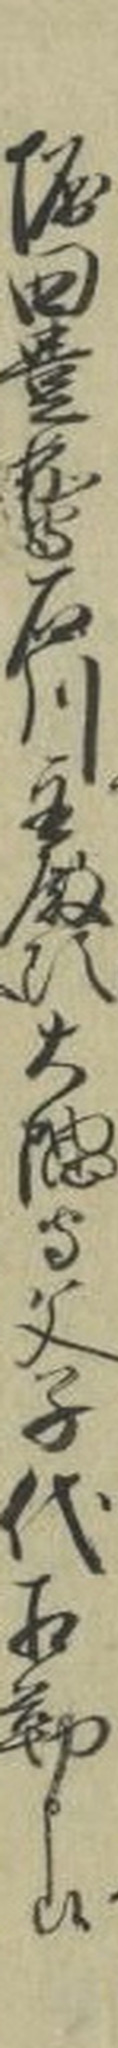一堀田豊前守石川主殿頭大隅守父子代相勤申候
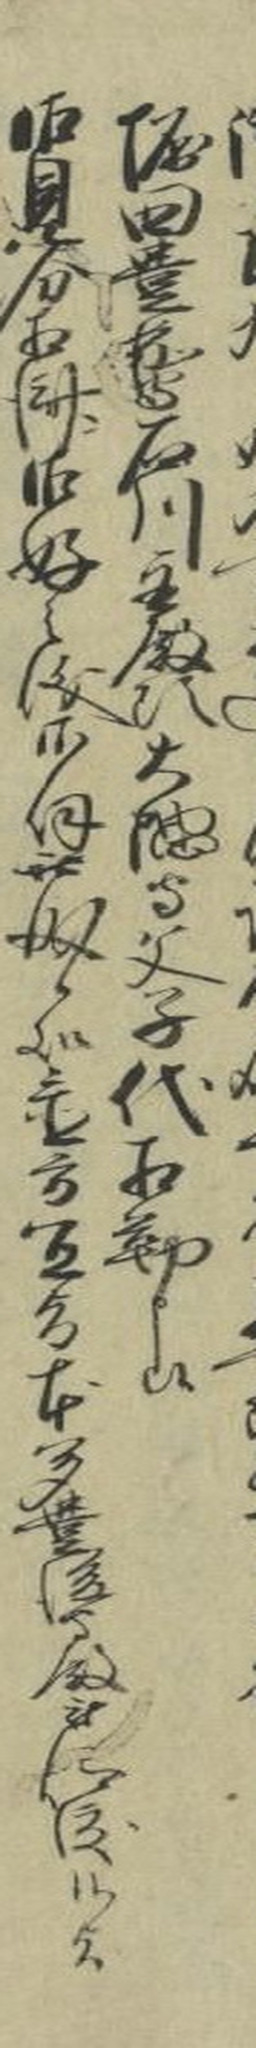一御見分相済御好之儀御伺被成候処置方宜旨本多豊後守殿被仰渡候旨
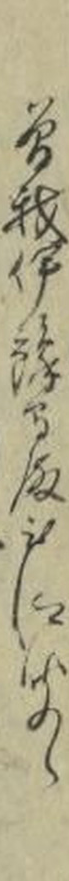曽我伊予守殿被仰聞候
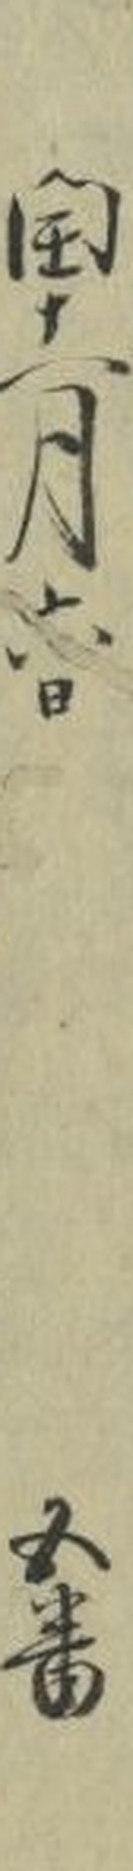閏十一月六日五番
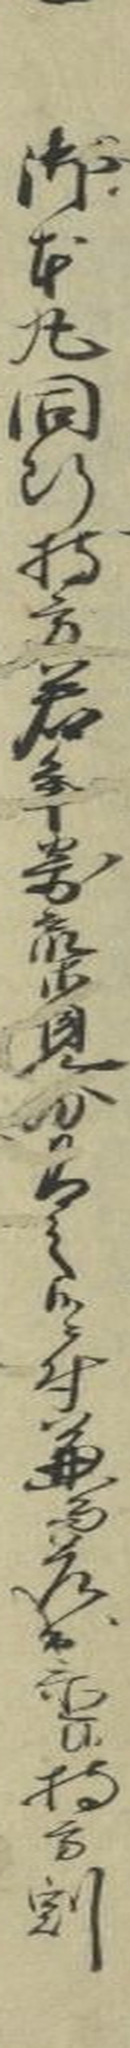一御本丸同断持方若年寄衆御見分有之候に付兼て差出置候持方割
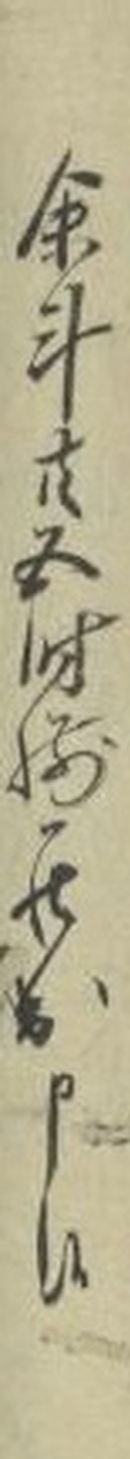余計共五時揃罷出申候
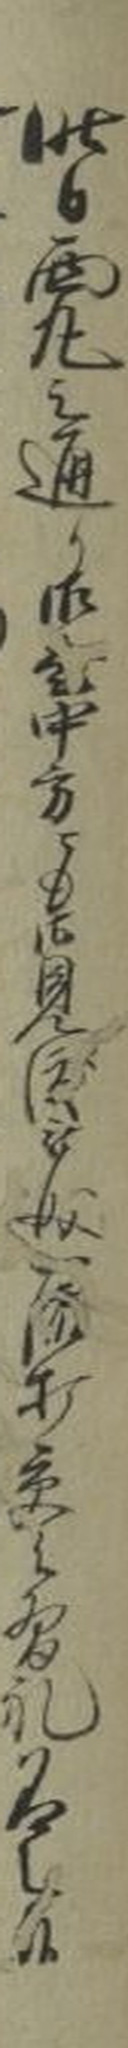一昨日西丸之通り御老中方にも御見渡被成一流打交之習礼有之候
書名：天保三壬辰年琉球人参府之節勤方書留
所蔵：University of the Ryukyus Library
